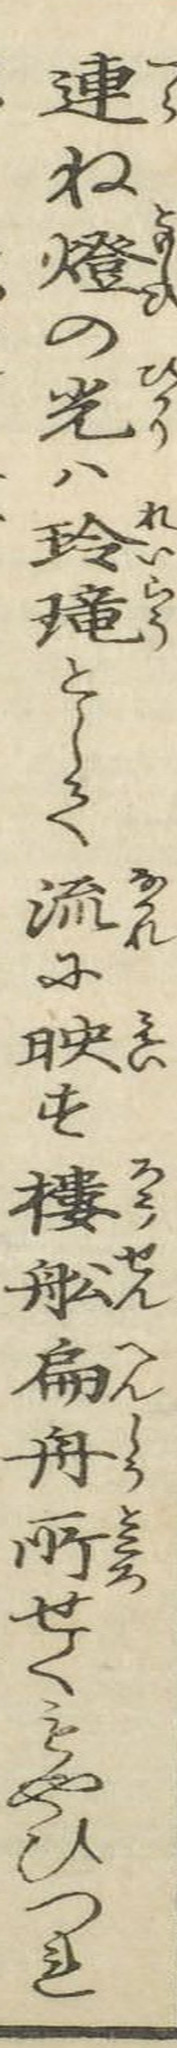連ね燈の光は玲瓏として流に映す楼船扁舟所せくもやひつれ
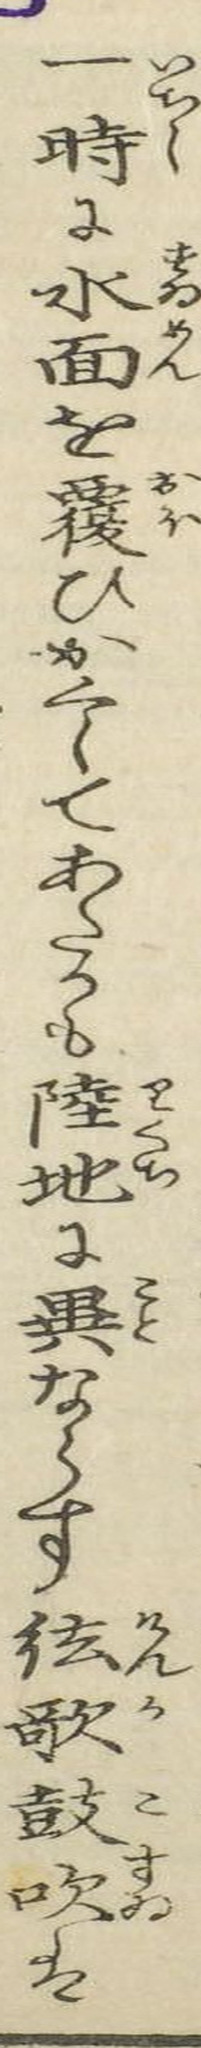一時に水面を覆ひかくしてあたかも陸地に異ならす弦歌鼓吹は
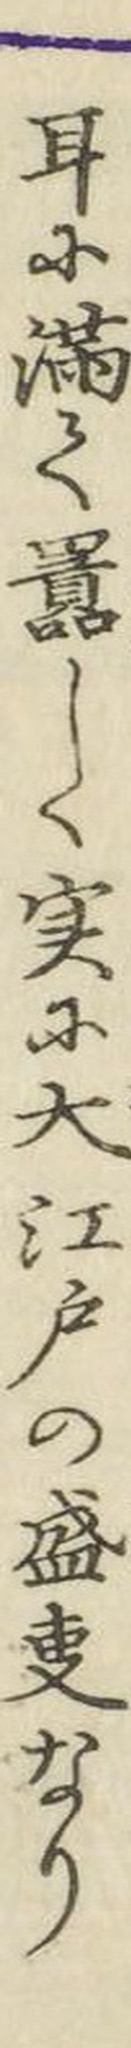耳に満て囂しく実に大江戸の盛事なり
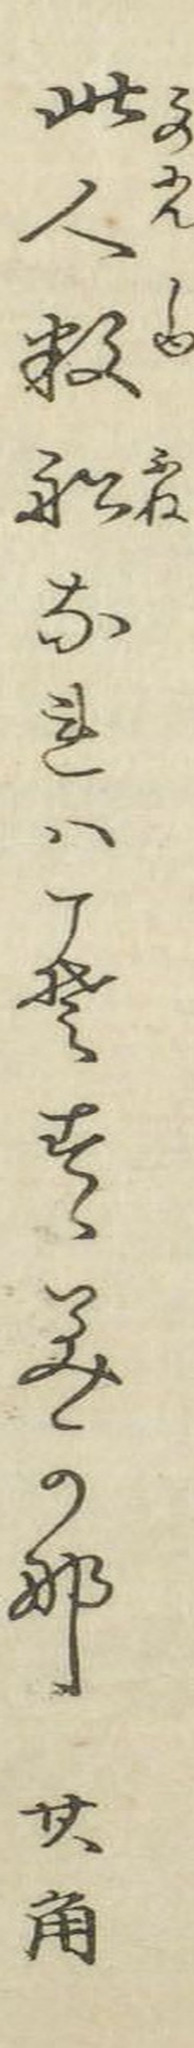此人数舩なれはこそすゝみかな其角
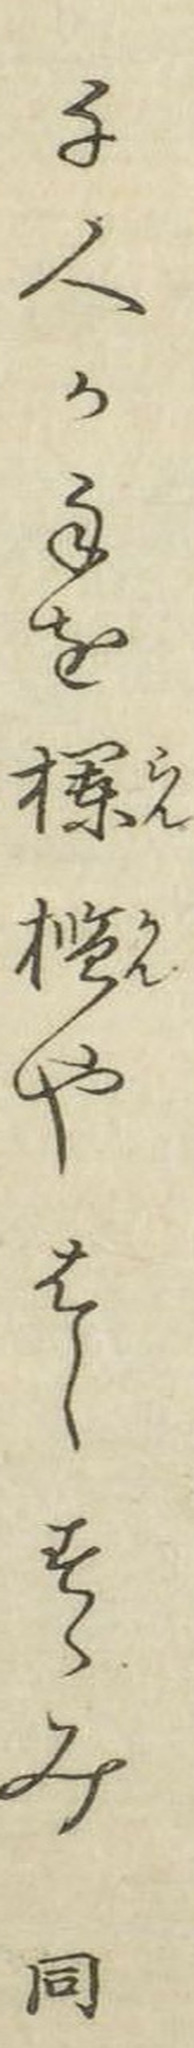千人か手を欄檻やはしすゝみ同
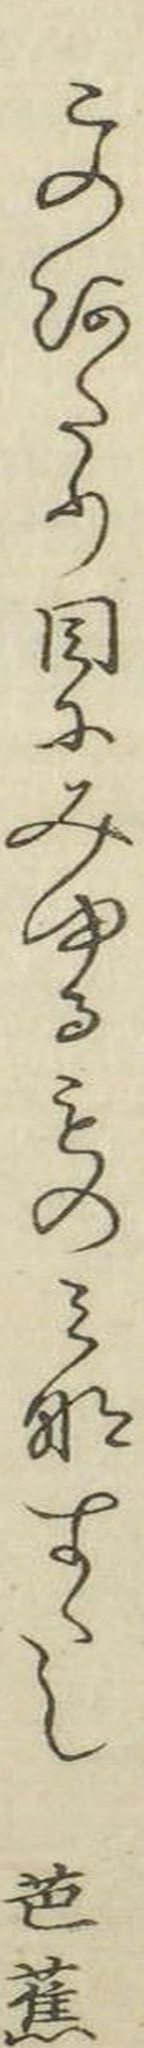このあたり目にみゆるものみなすゝし芭蕉
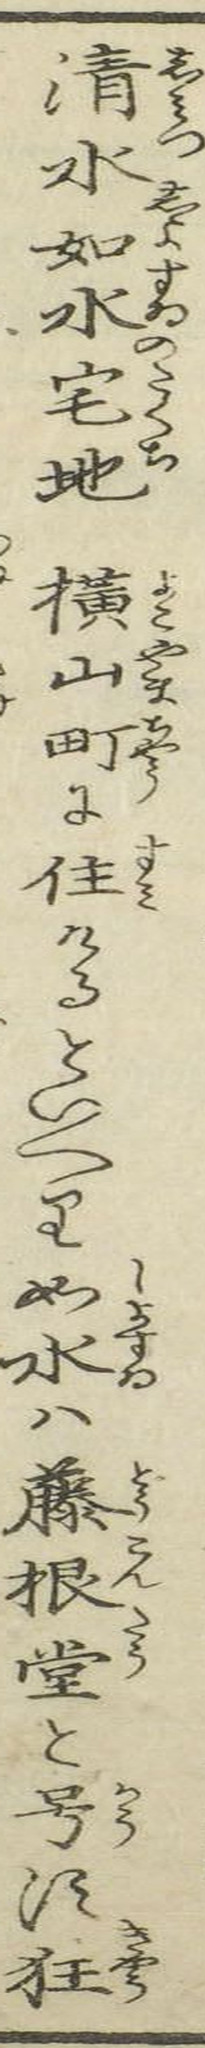清水如水宅地横山町に住けるといへり如水は藤根堂と号す狂
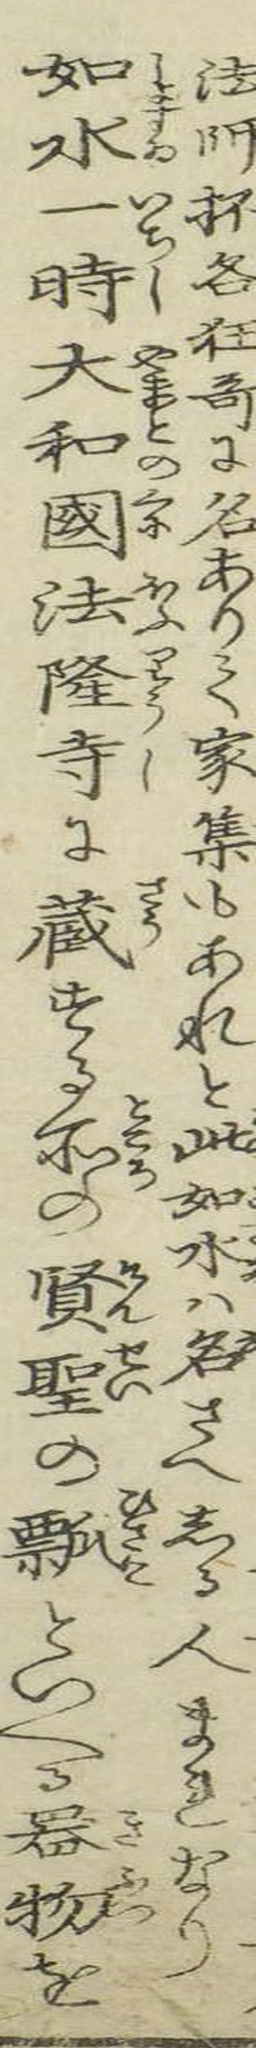如水一時大和国法隆寺に蔵する所の賢聖の瓢といへる器物を
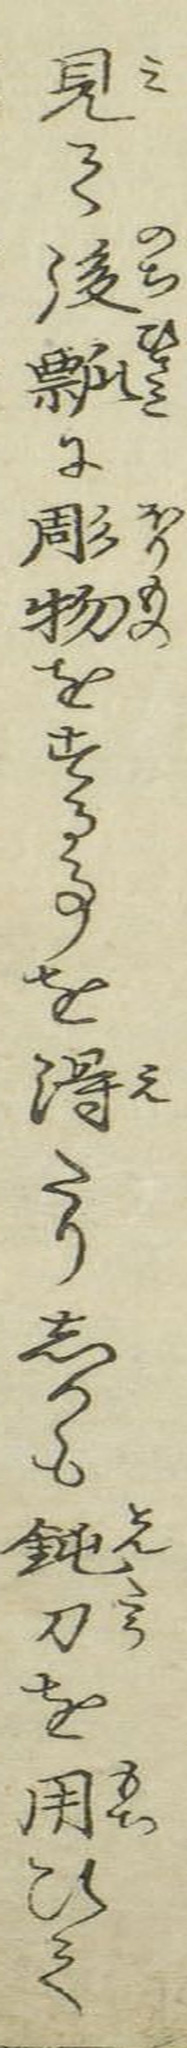見て後瓢に彫物をする事を得たりしかも鈍刀を用ひて
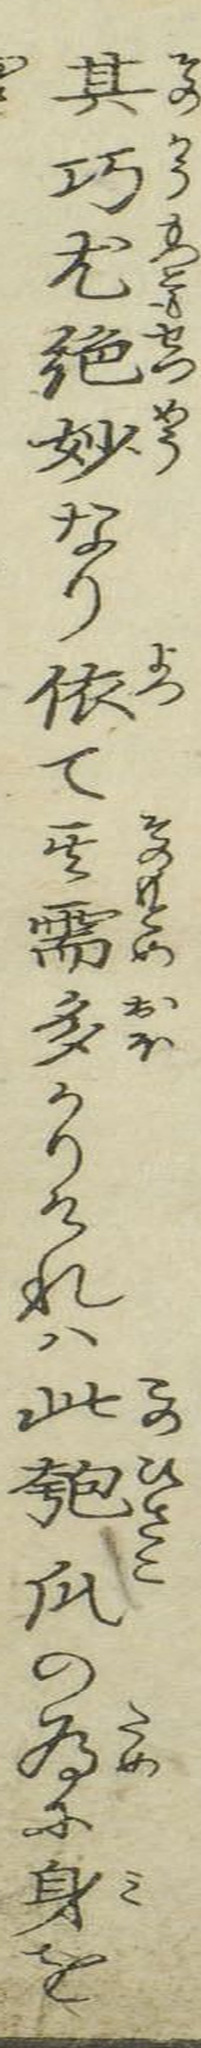其巧尤絶妙なり依て其需多かりけれは此匏瓜の為に身を
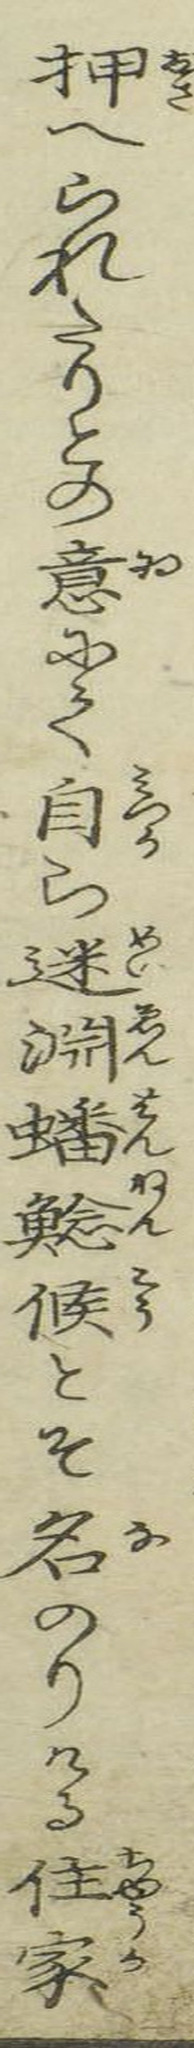押へられたりとの意にて自ら迷淵蟠鯰候とそ名のりける住家

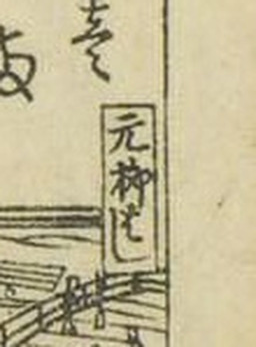元柳はし

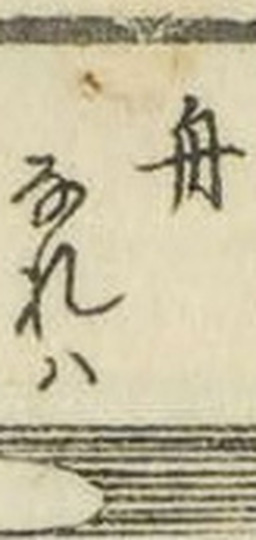なれは
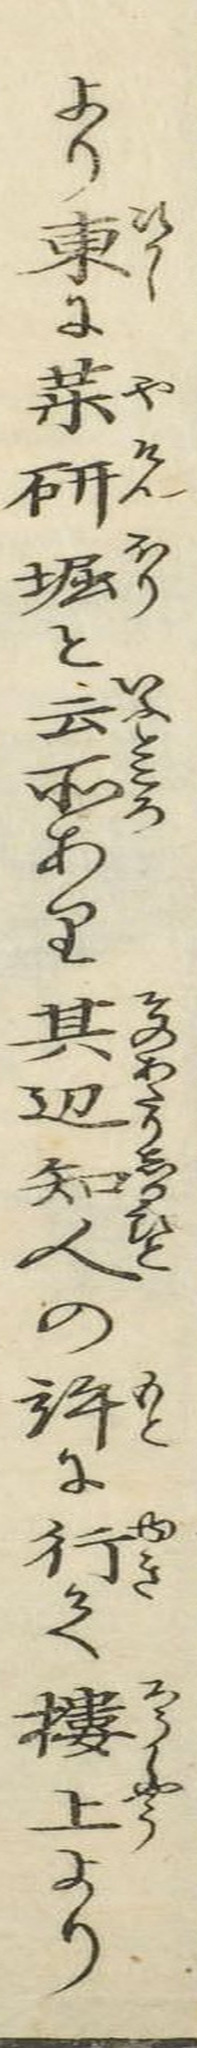より東に薬研堀と云所あり其辺知人の許に行て楼上より
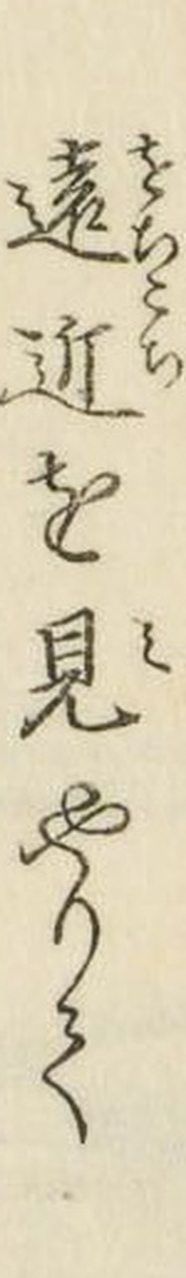遠近を見やりて
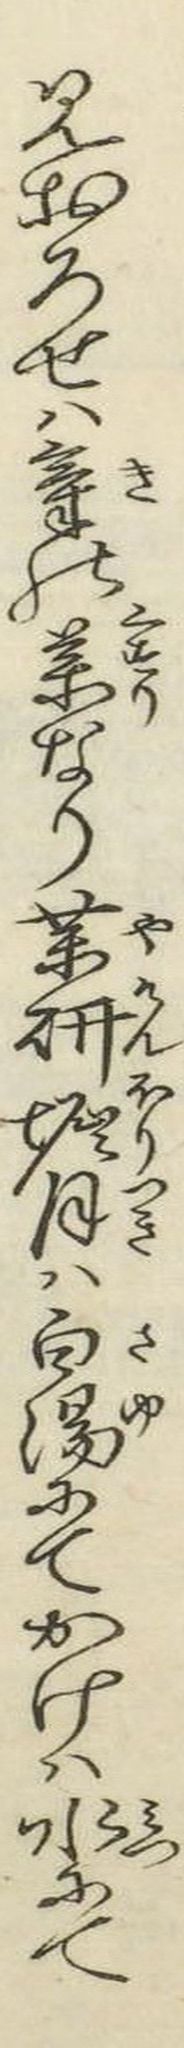見おろせは気の薬なり薬研堀月は白湯にてかけは水にて
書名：江戸名所図会 20巻 巻之2
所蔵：東京学芸大学教育コンテンツアーカイブ
